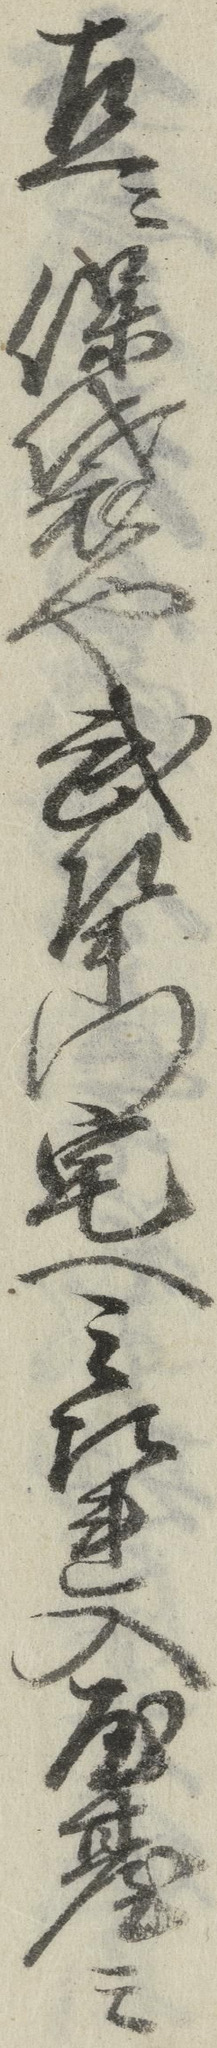直に保袋や武左衛門宅へみたれ入屋台み
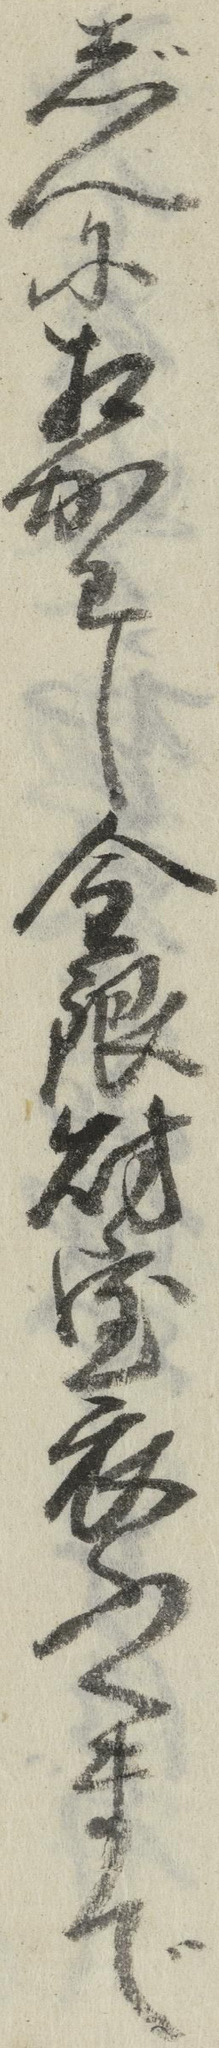じんに相かわし金銀財宝衣ふくまで
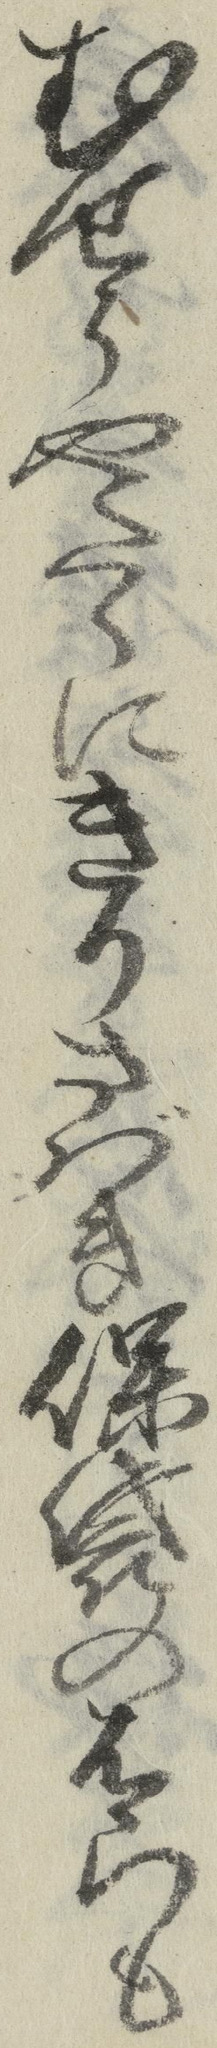むせうやたらにきりさばき保袋のはらも

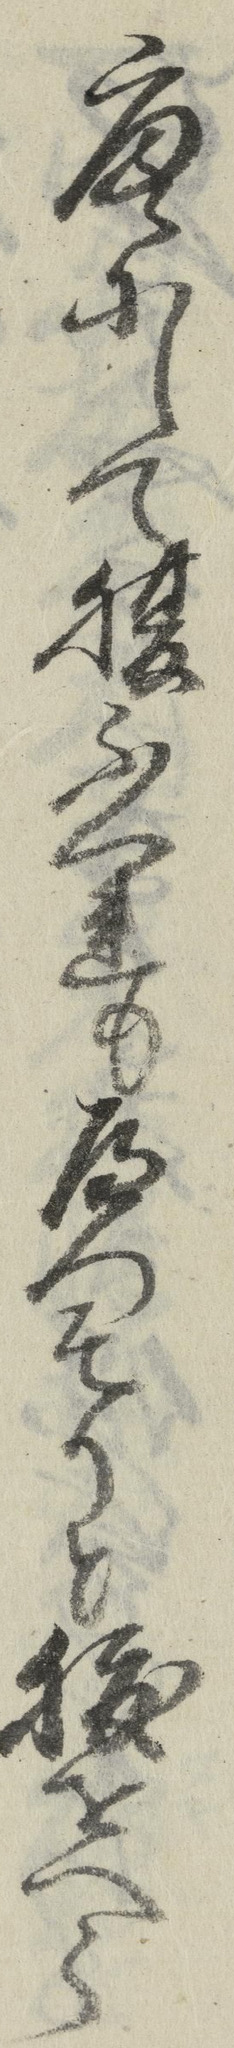唐にして腹ふくれもへつそりと腹をへら
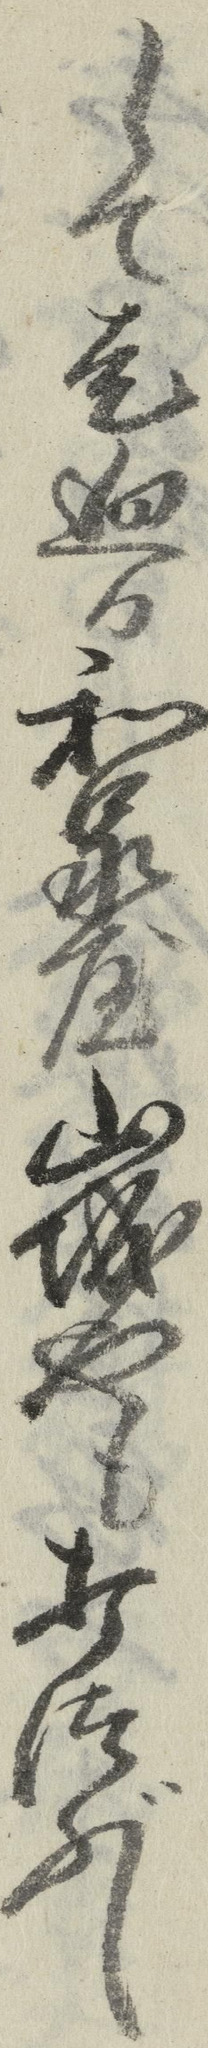して走廻り和泉屋山城やも打つぶし
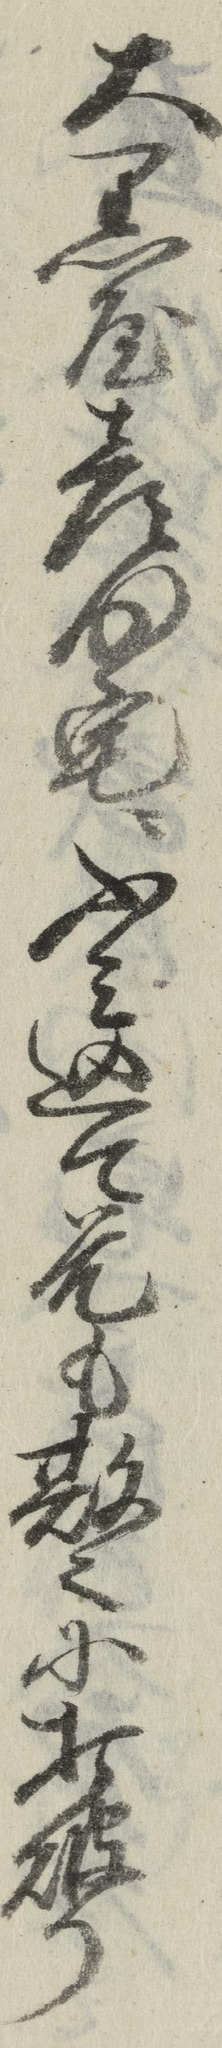大黒屋彦兵衛宅にふみ込て是も散々に打破り
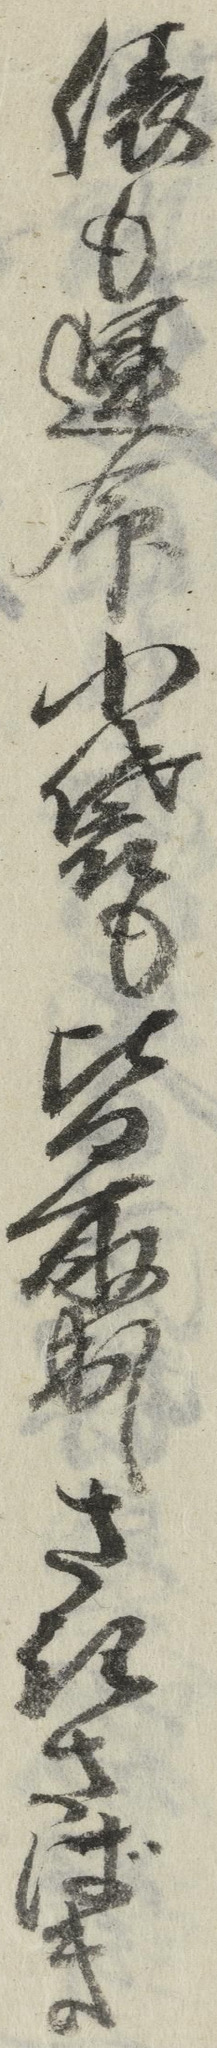俵も運命小袋も皆取出しさきさばき
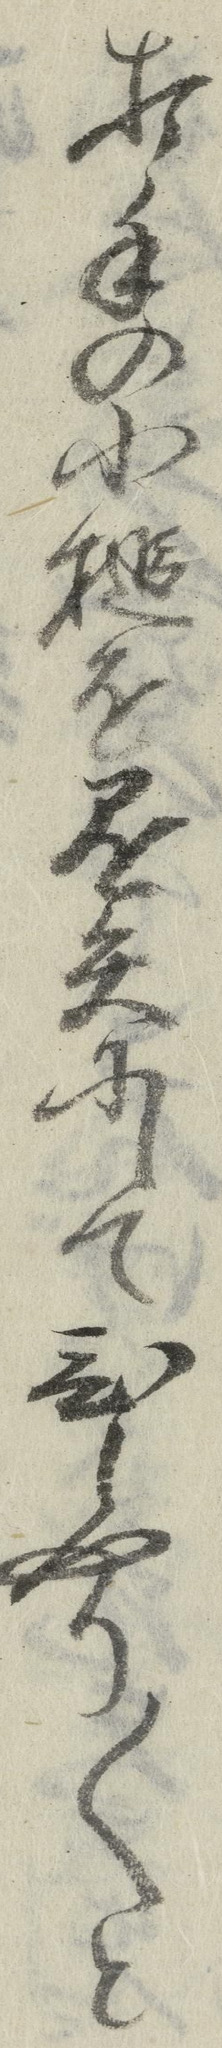打手の小槌を懸矢にしてひしやり〳〵と
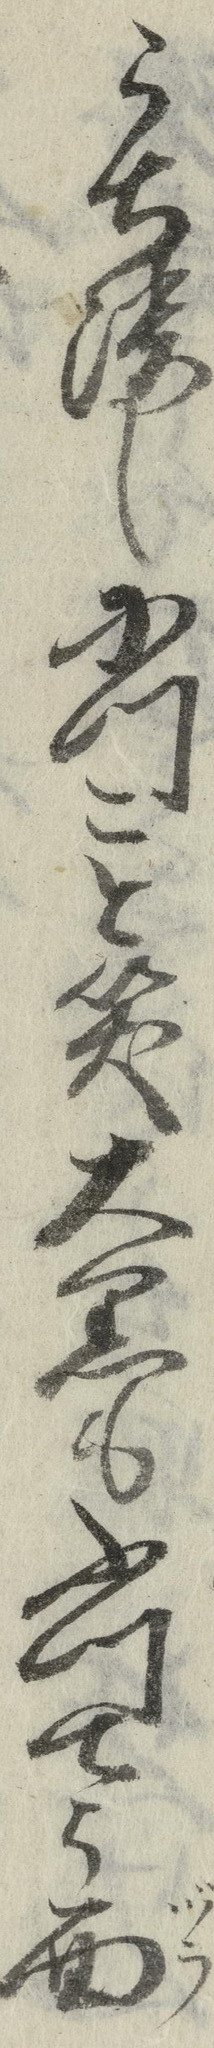うち潰しにつこと笑大黒もふつてう面
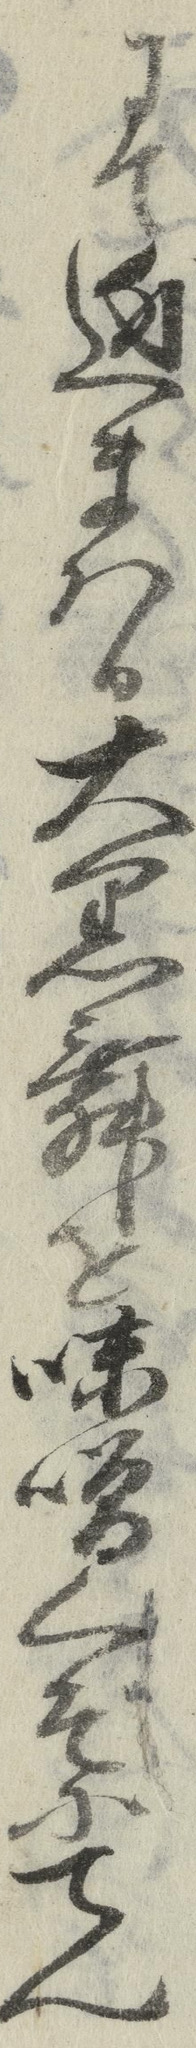にて迯まはる大黒舞を味噌くそにてん
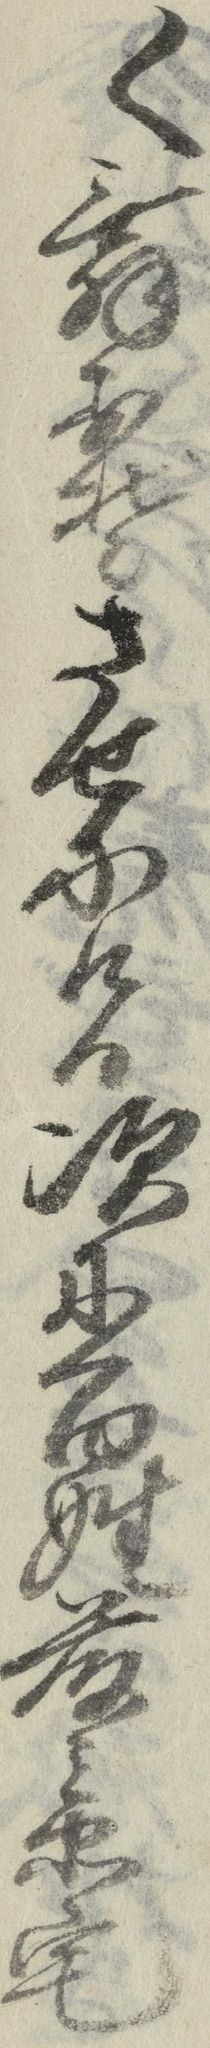〳〵舞おぞさせにける次に百姓藤兵衛宅
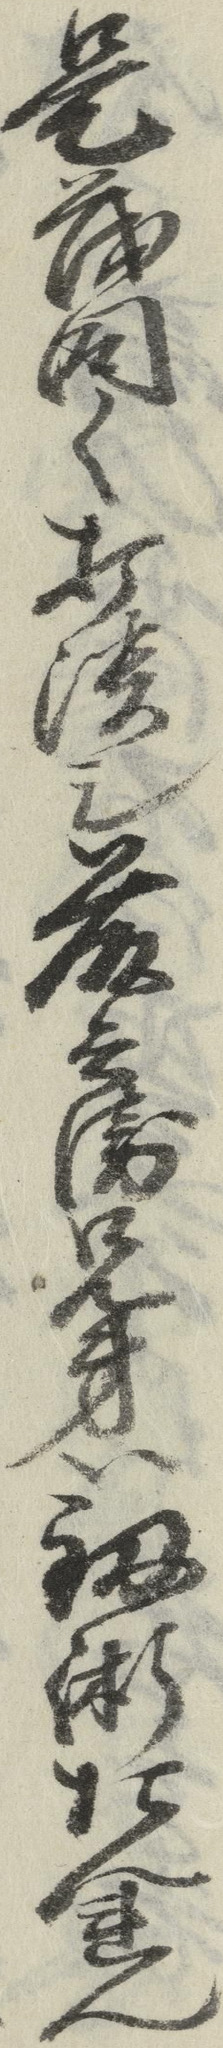是も同く打潰し藤兵衛兄弟は釼術たんれん
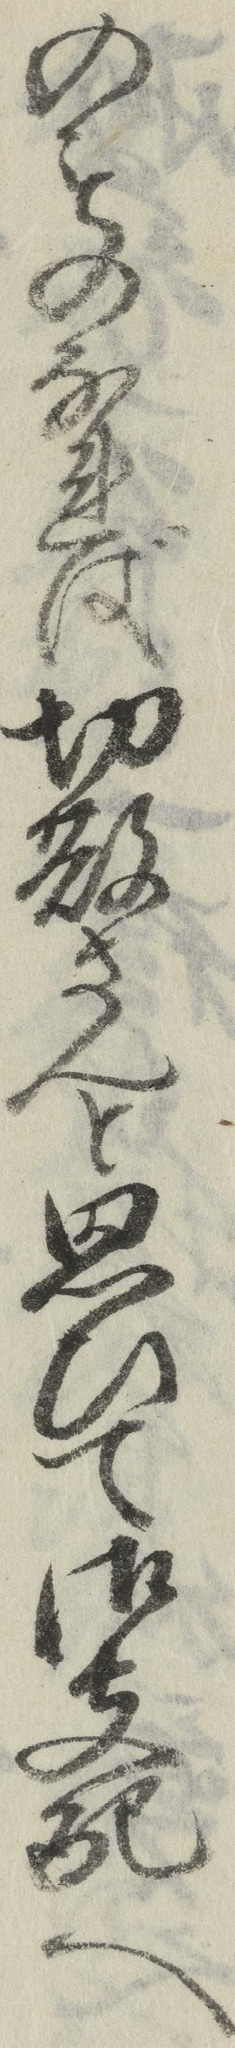のものなれば切散さんと思ひて御支配へ
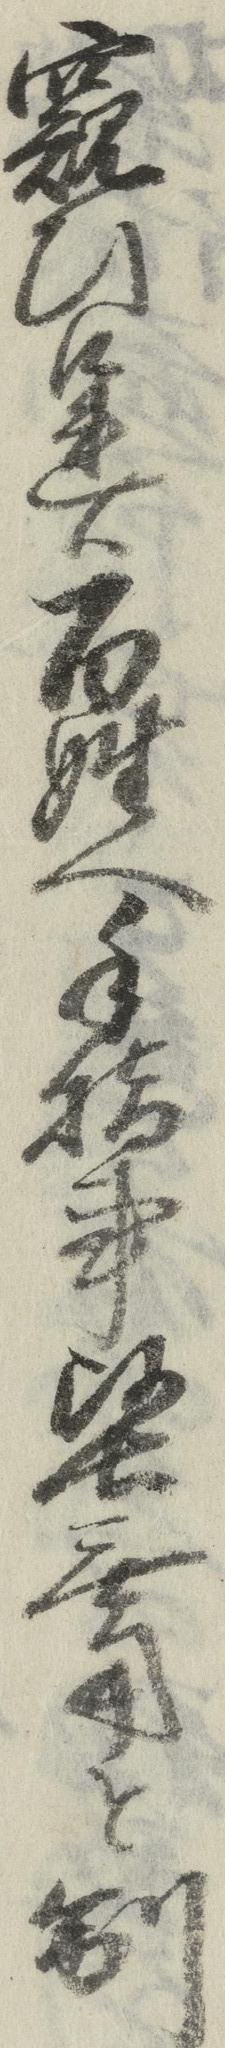窺ひけれは百姓へ手指事堅無用と制
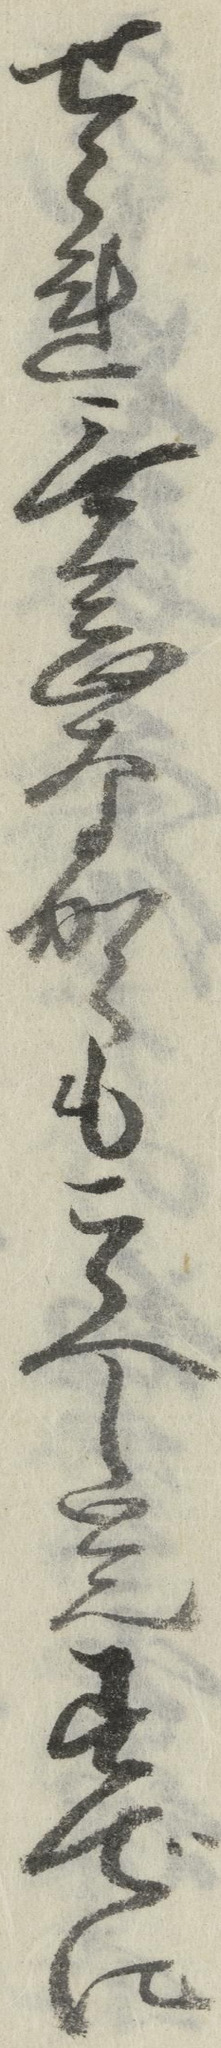せられ無甚なからもこらへしと也すでに
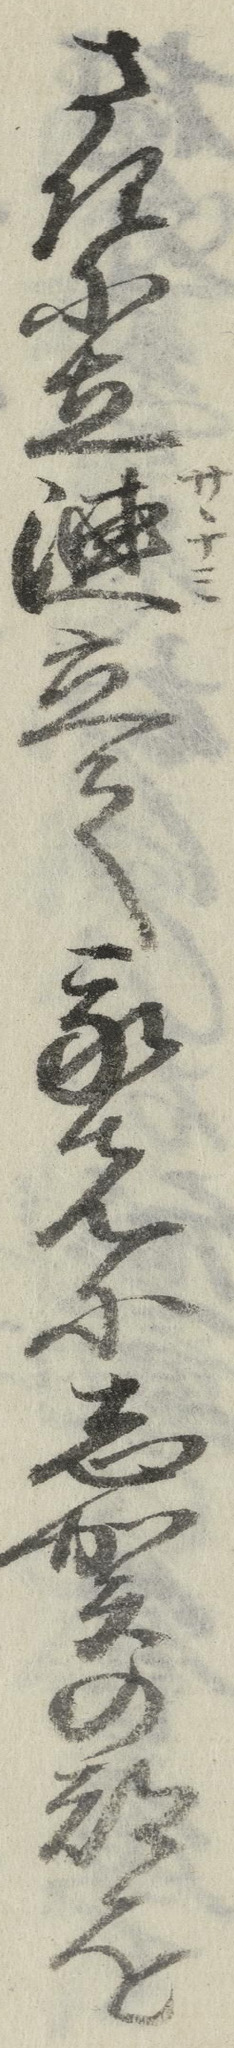さきに立漣立て吾先に志賀の都を
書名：浅間大焼騒動記　中
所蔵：東京大学地震研究所図書室 Earthquake Research Institute Library, The University of Tokyo, JAPAN
